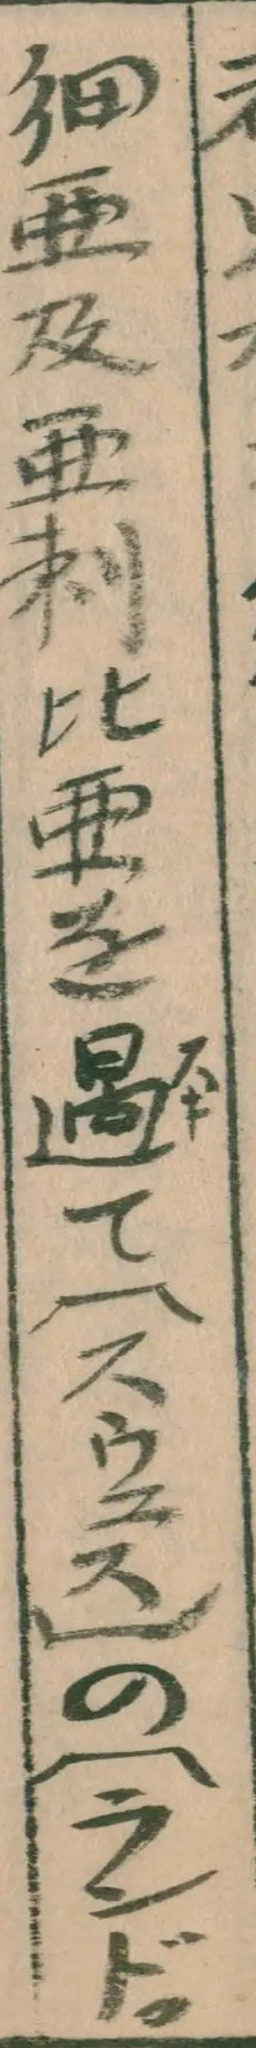細亜及亜刺比亜を過て(スウェス)の(ランド・
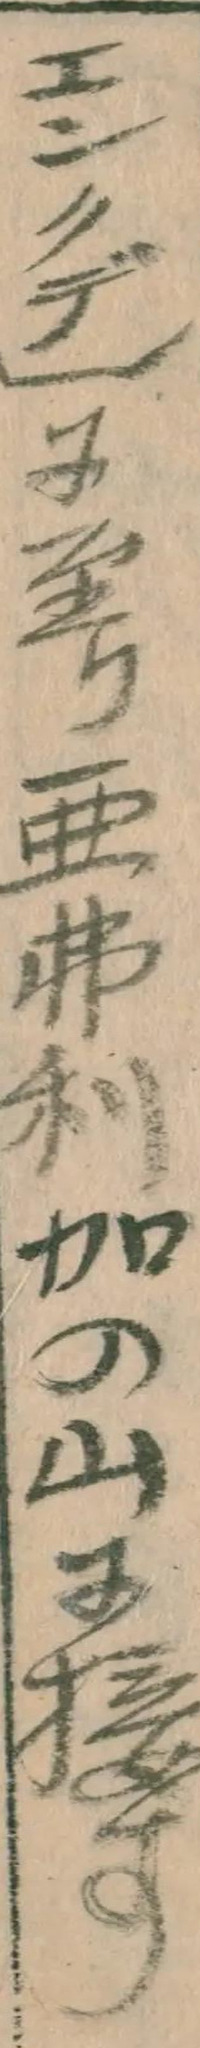エングテ)に至り亜弗利加の山に接す
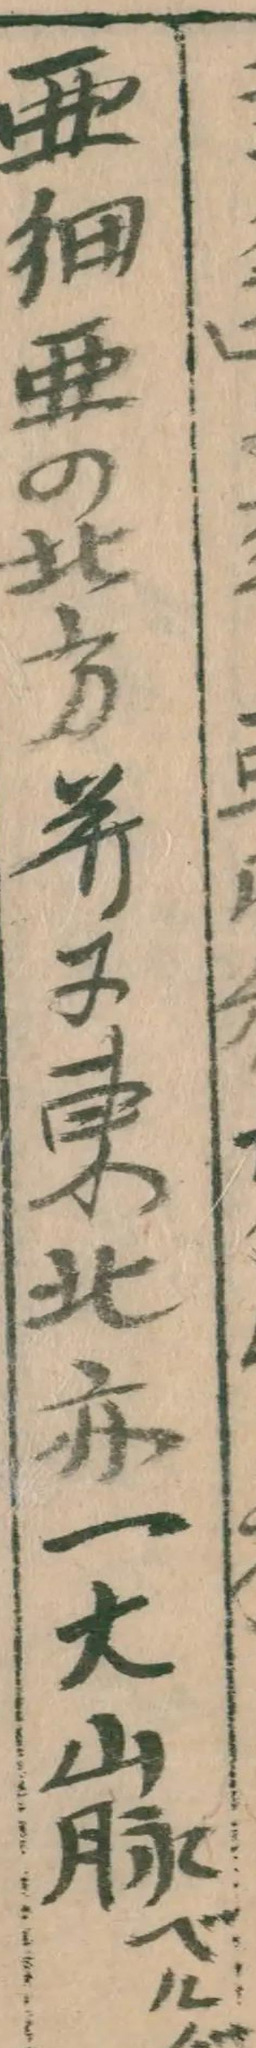亜細亜の北方并に東北亦一大山脈ベルグ
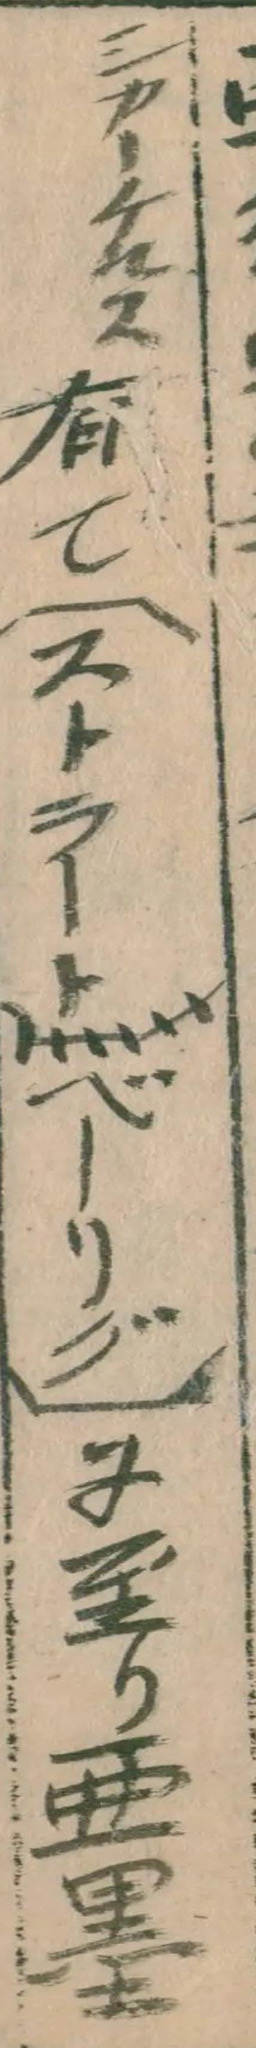シカーケルス有て(ストラートベーリグ)に至り亜墨
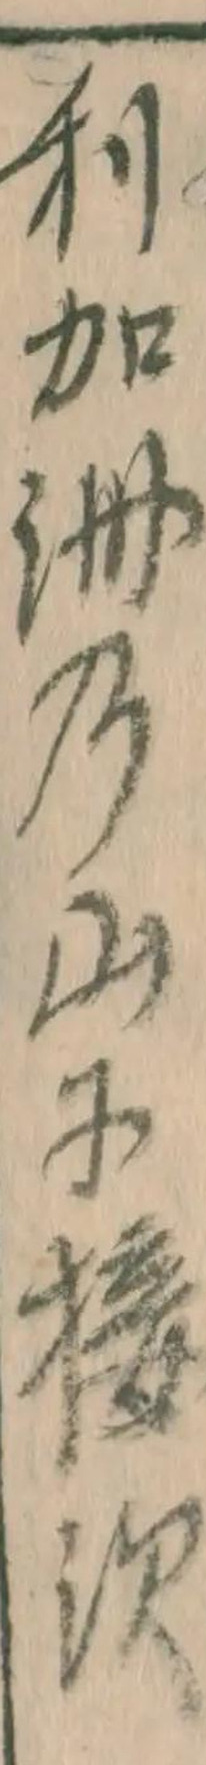利加洲の山に接す

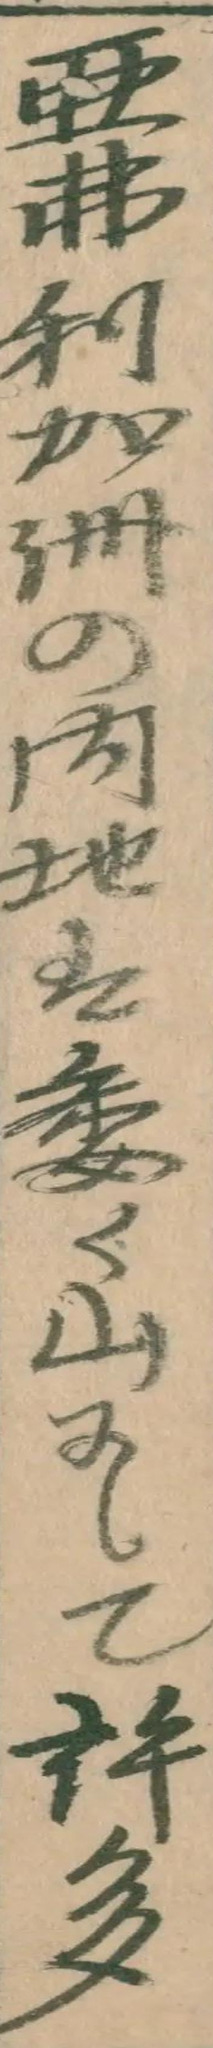亜弗利加洲の内地は委く山にして許多
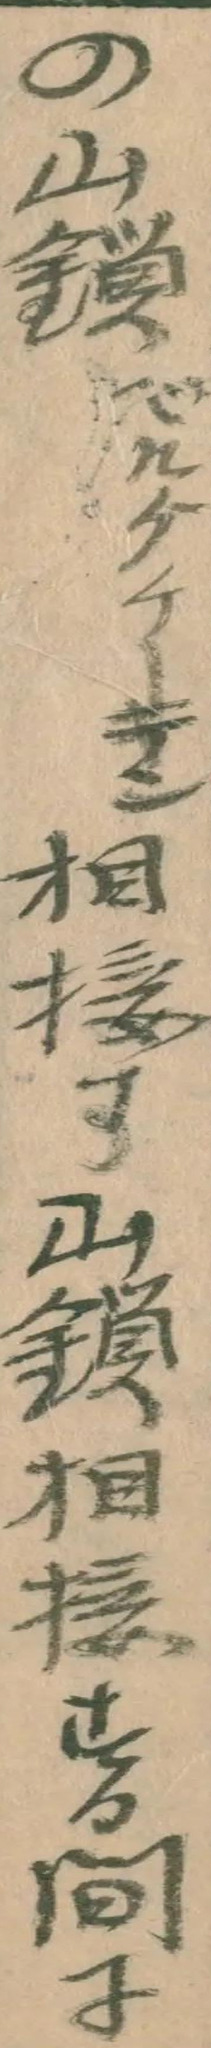の山鎖ベルグケーテン相接す山鎖相接する間に
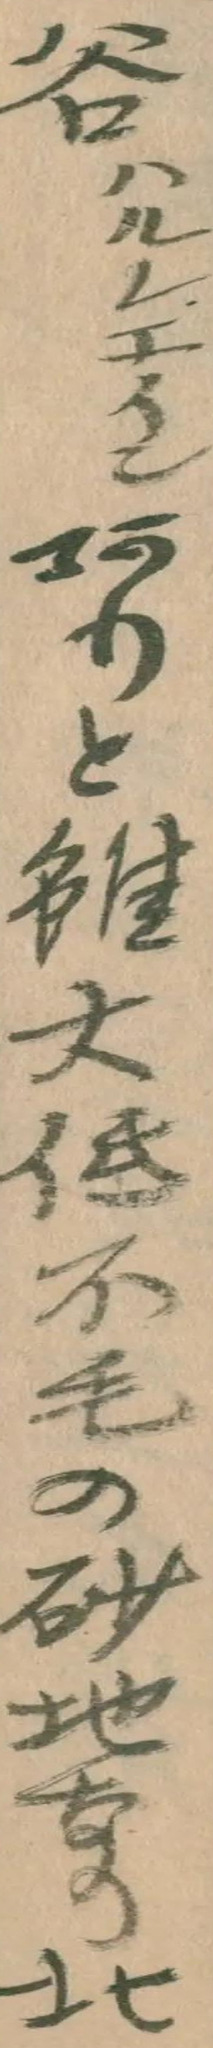谷ハルレエインありと雖大低不毛の砂地なり北
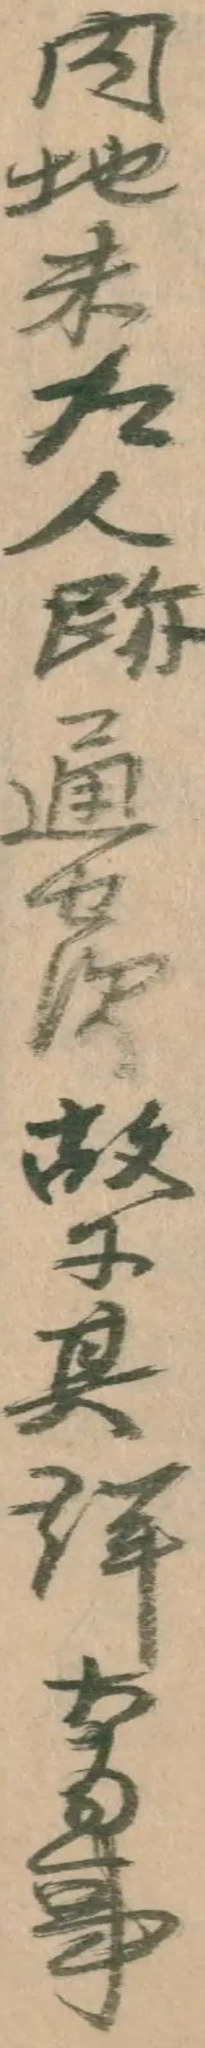内地未た人跡通せす故に其詳なる事
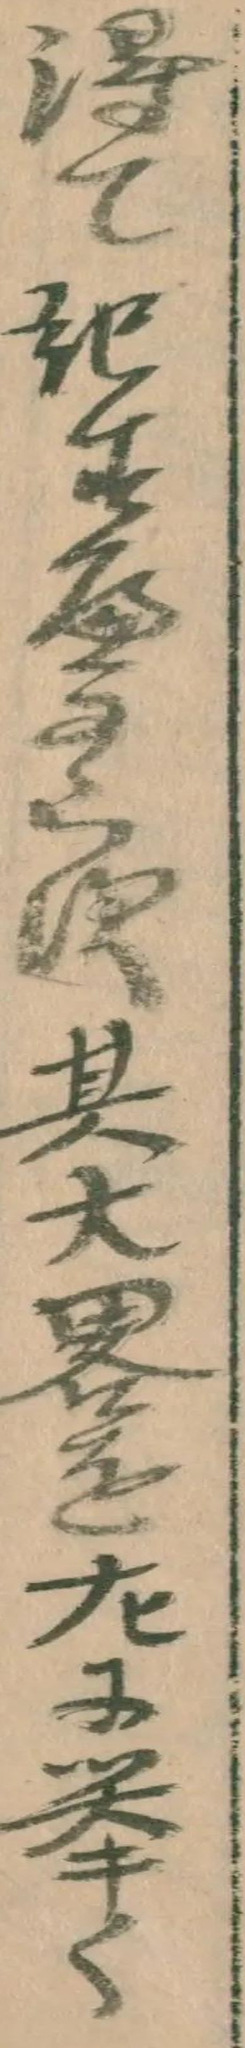得て記すへからす其大略を左に挙く
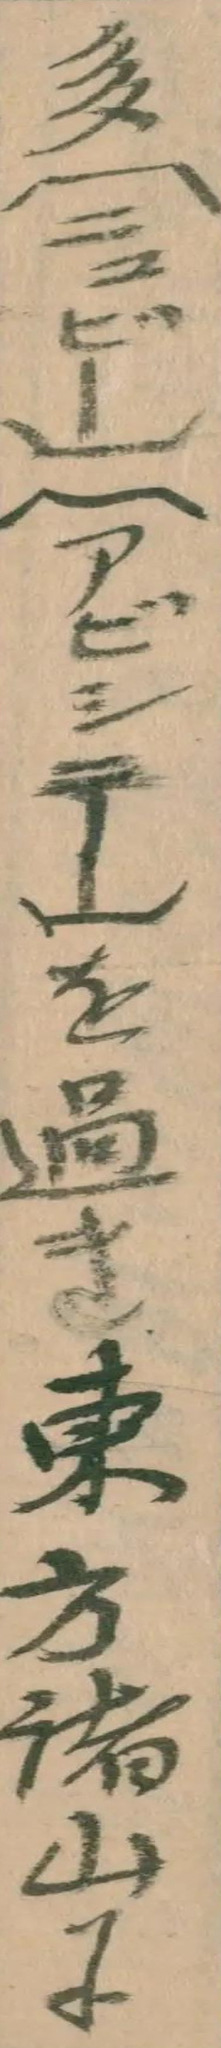多(ニュビー)(アビシニー)を過き東方諸山に
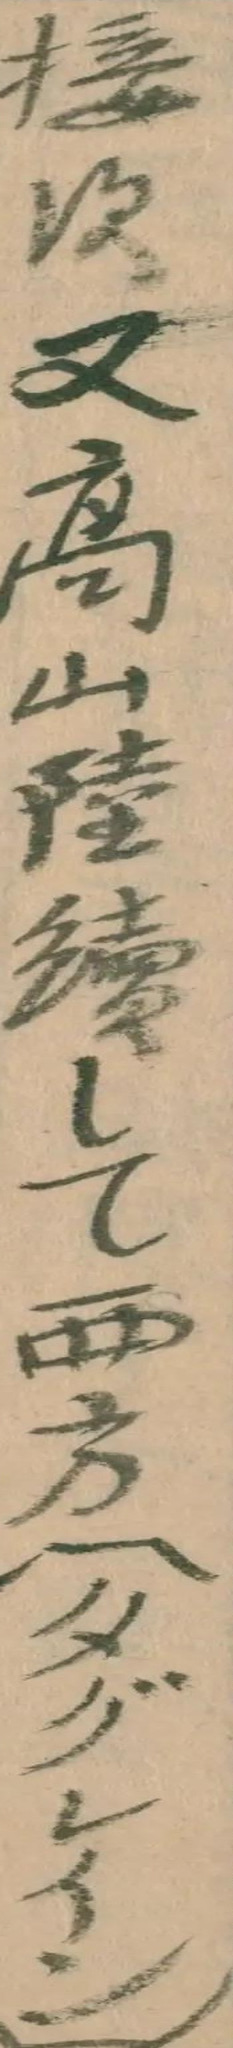接す又高山陸続して西方(タグレイン)
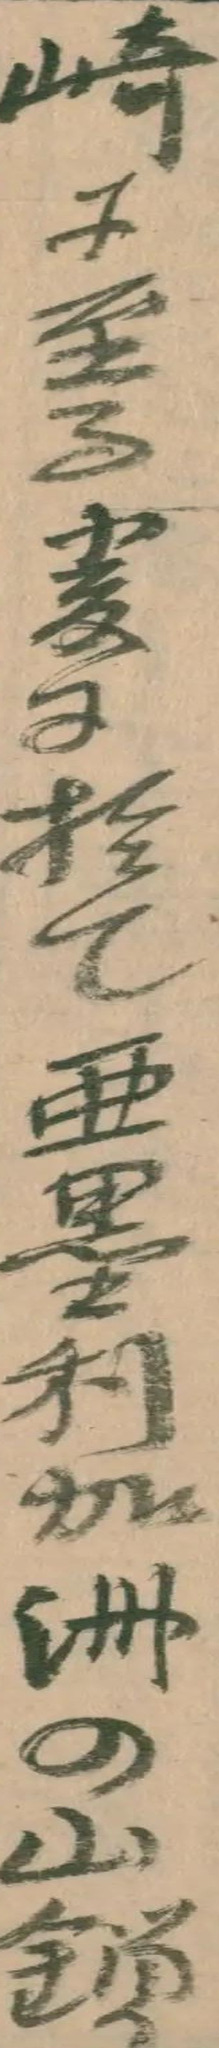崎に至る爰に於て亜墨利加洲の山鎖
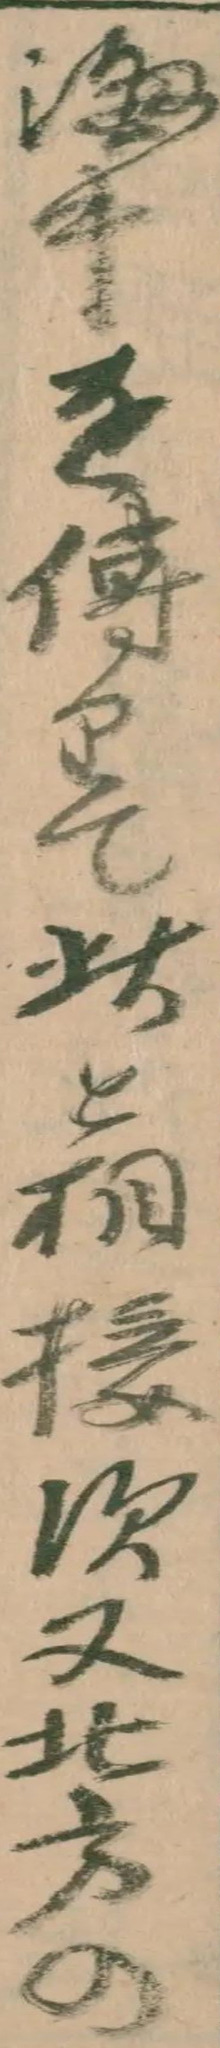海中を伝りて此と相接す又北方の
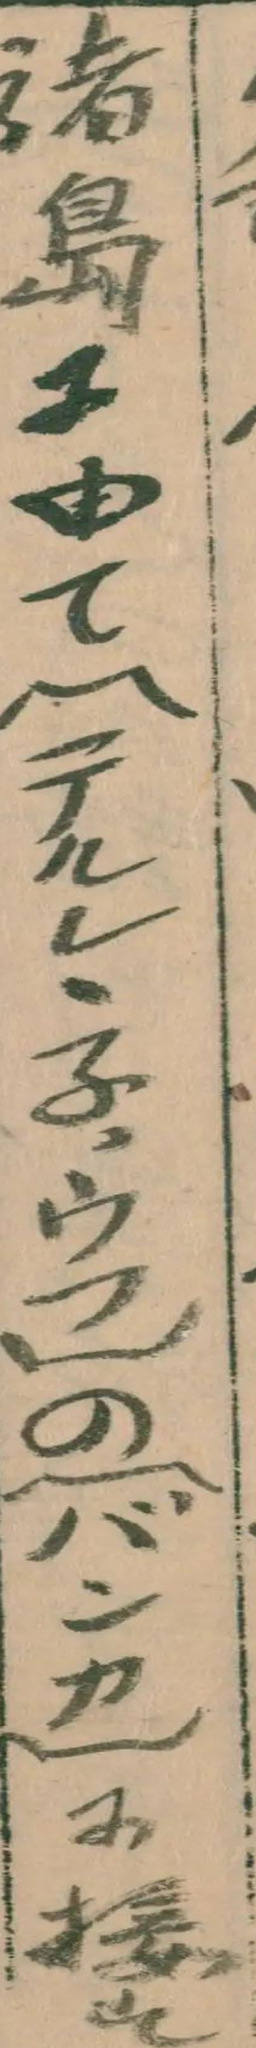諸島に由て(テルレ・ネ・ウフ)の(バンカ)に接す
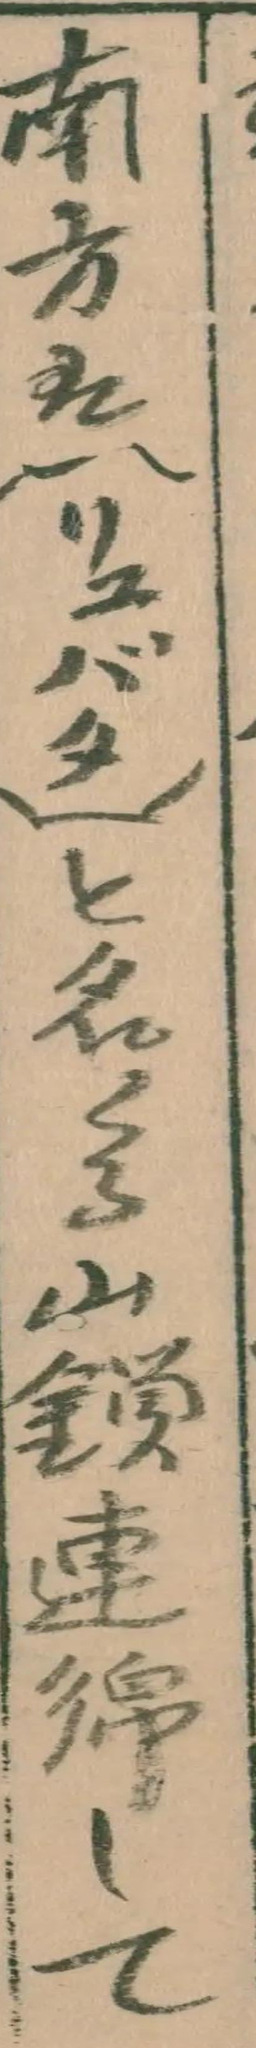南方は(リュバタ)と名くる山鎖連綿して
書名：新釈輿地図説
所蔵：国立国会図書館 National Diet Library, JAPAN
